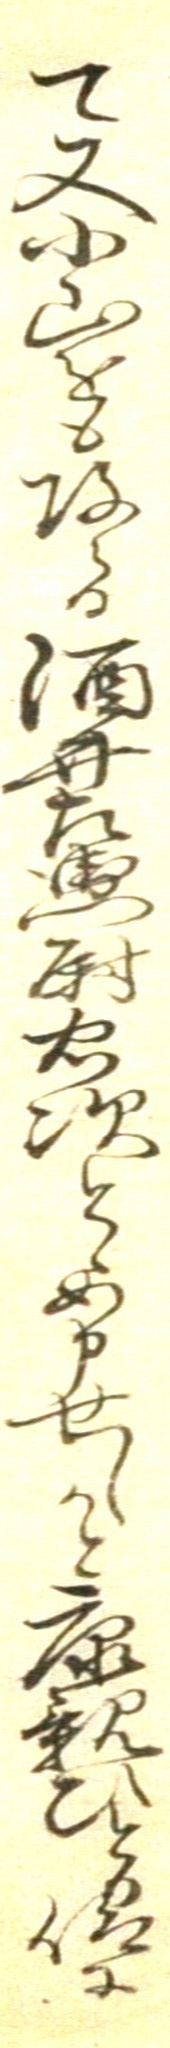て又小山をも攻らる酒井左衛門尉忠次とゝめ申せしかと康親ひとり仰に
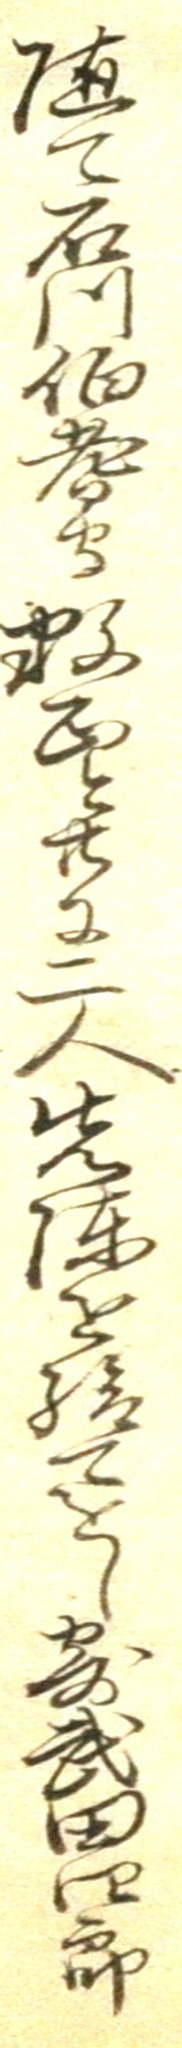随て石川伯耆守数正と共に二人先陣を給てをし寄武田四郎
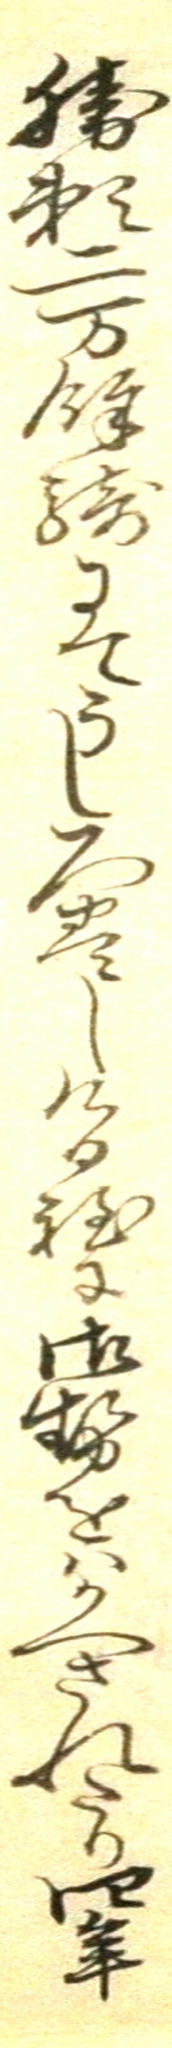勝頼二万余騎にてうしろ巻しける程に御勢をはかへされたり四年
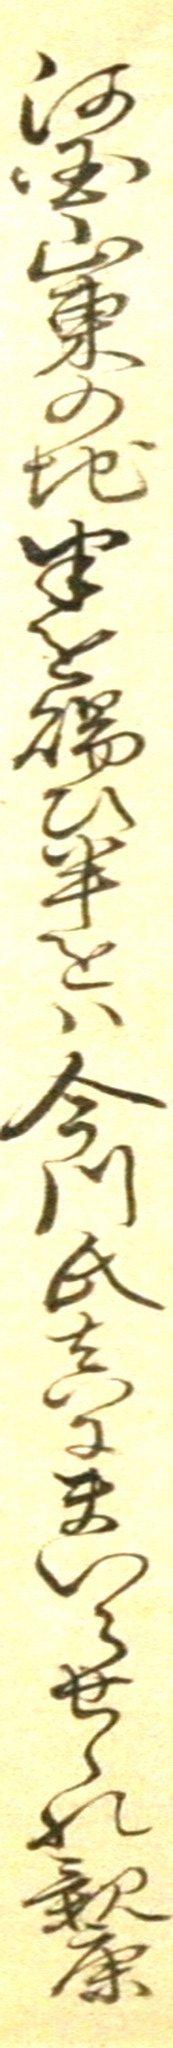河国山東の地半を賜ひ半をは今川氏真にまいらせられ親康

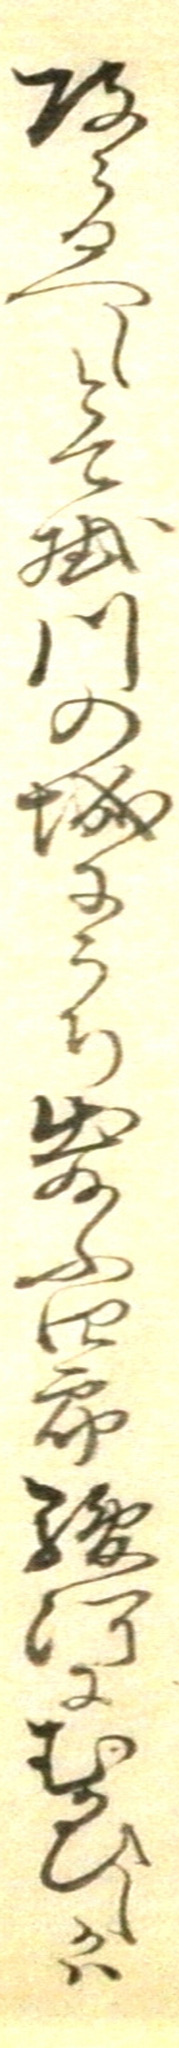攻らるへしとて掛川の城にうち出給ふ四郎駿河にむかひしかは
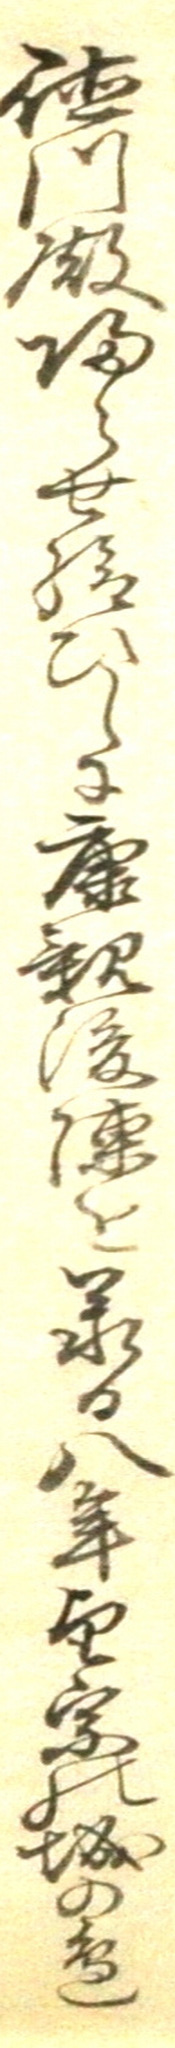徳川殿帰らせ給ひしに康親後陣を承る八年望宗の城の辺
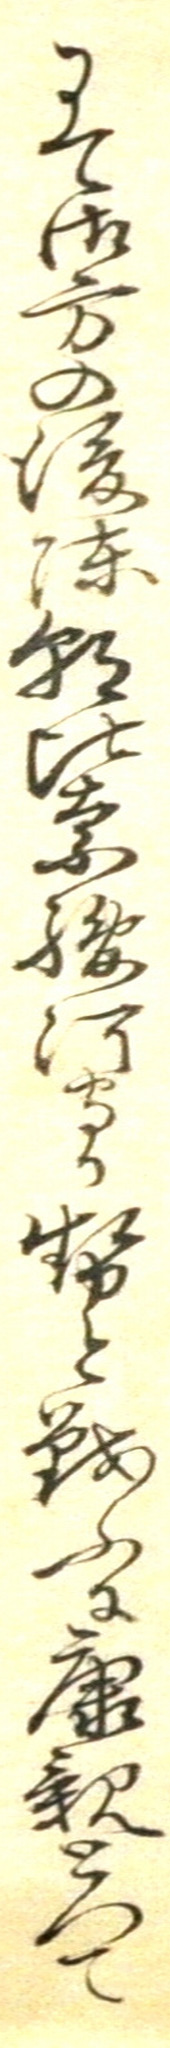にて御方の後陣朝比奈駿河守か勢と戦ふに康親とつて
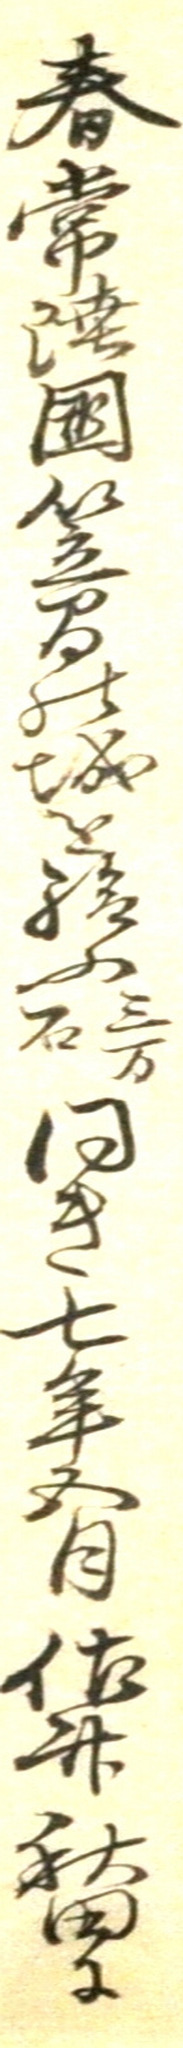春常陸国笠間の城を給ふ三万石同き七年五月佐竹秋田に
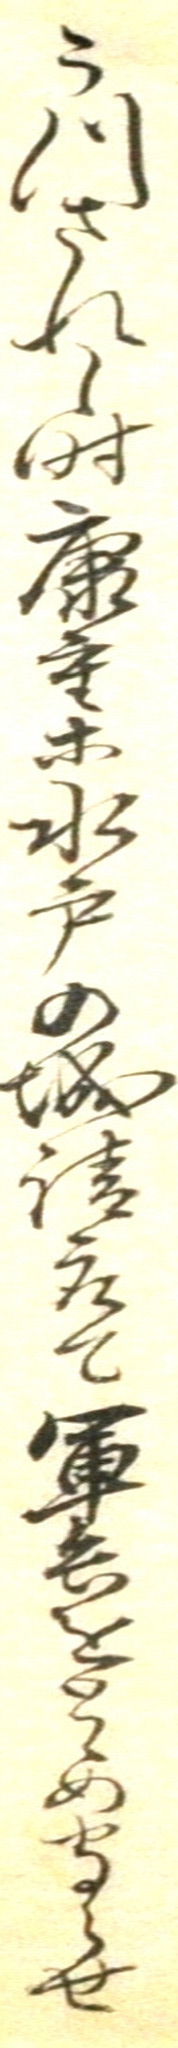うつされし時康重等水戸の城請取て軍兵をとゝめ守らせ
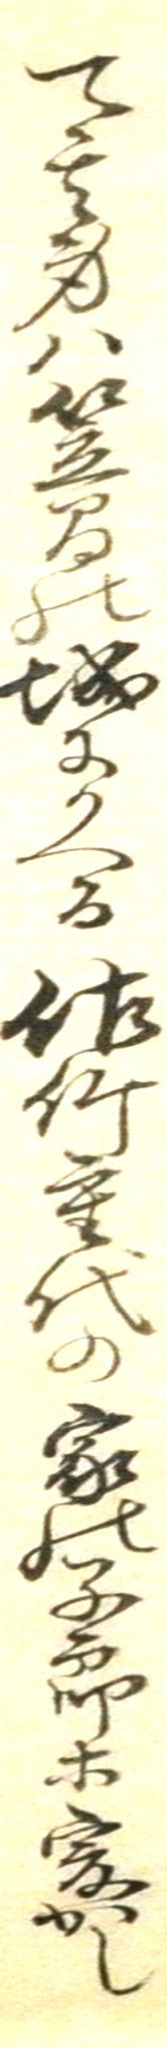て其身は笠間の城にかへる佐竹重代の家の子郎等爰かし
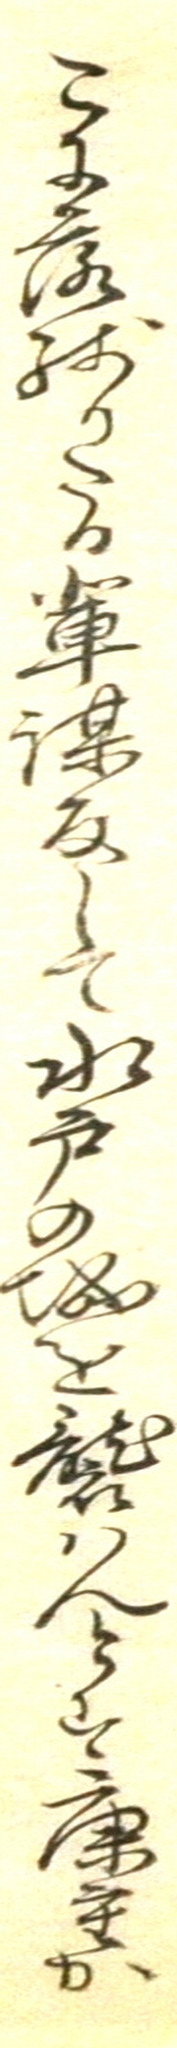こに落残りたる輩謀反して水戸の城を襲はんとす康重か
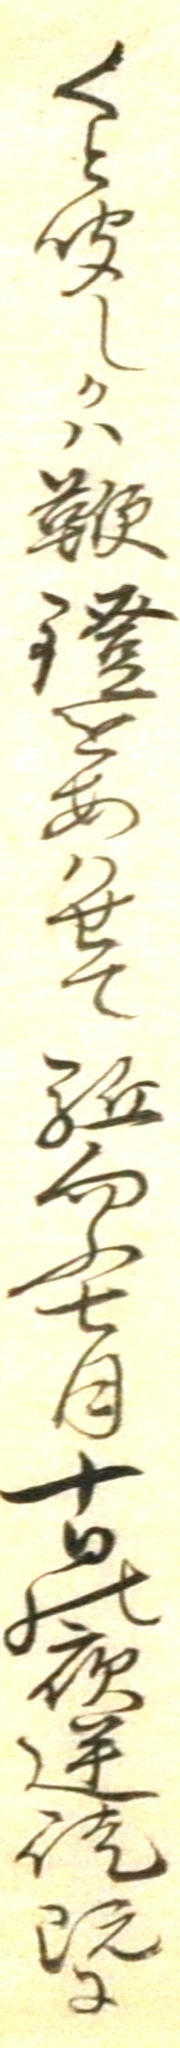くと聞しかは鞭鞍をあはせて駈向ふ七月十日の夜逆徒既に
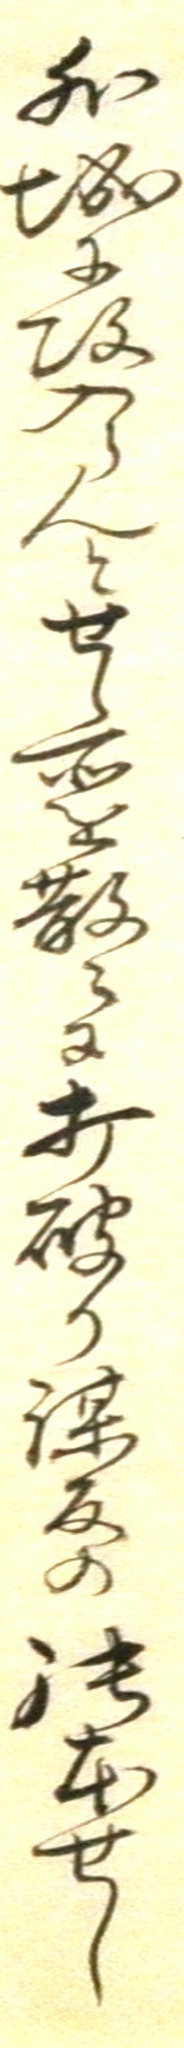外城に攻入らんとせし所を散々に打破り謀反の張本せし
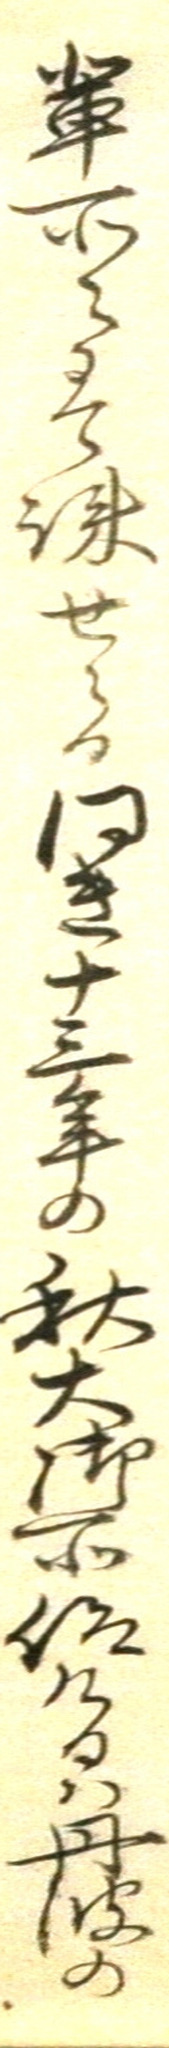輩所々にて誅せらる同き十三年の秋大御所仰けるは丹波の
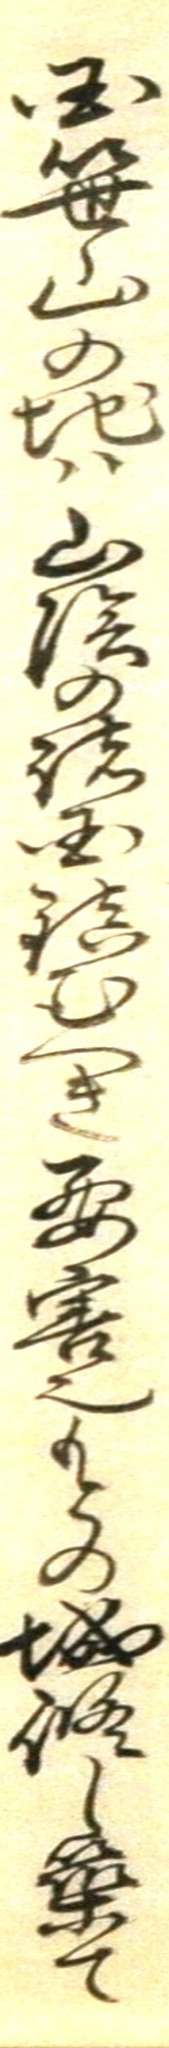国笹山の地は山陰の諸国鎮むへき要害也もとの城修し築て
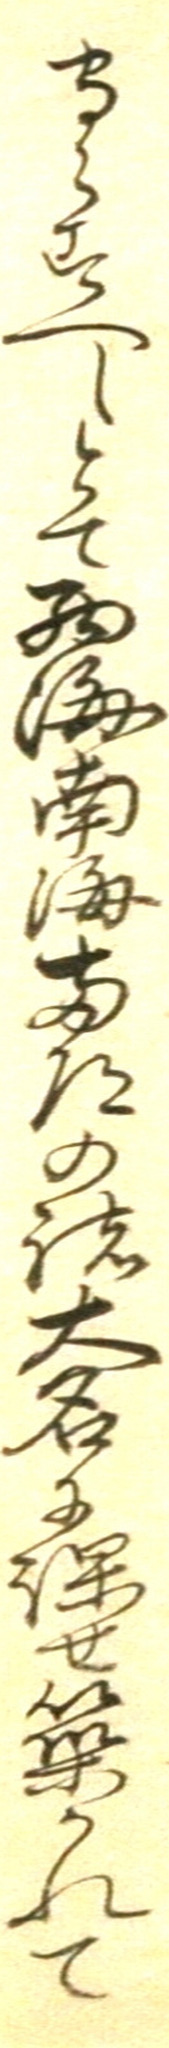守らすへしとて西海南海両道の諸大名に課せ築かれて
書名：藩翰譜（四・下）
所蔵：伊那市立高遠町図書館・合同会社AMANE
